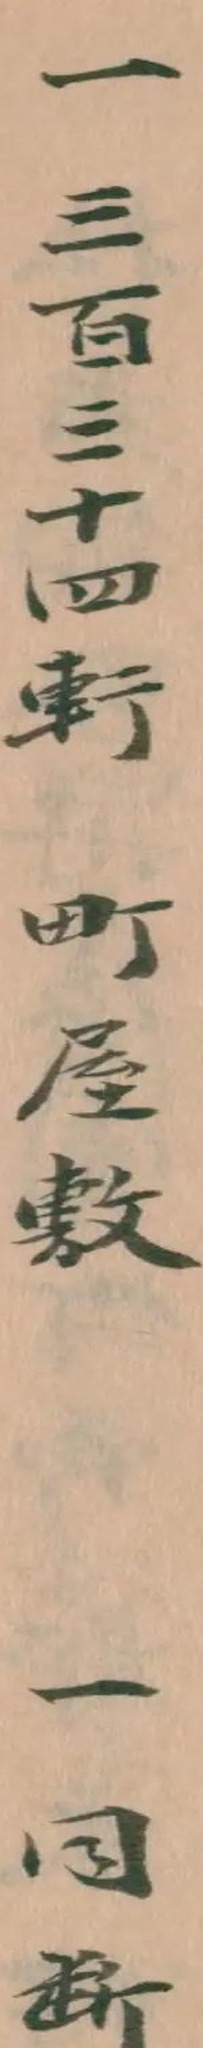一三百三十四軒町屋敷一同断修験
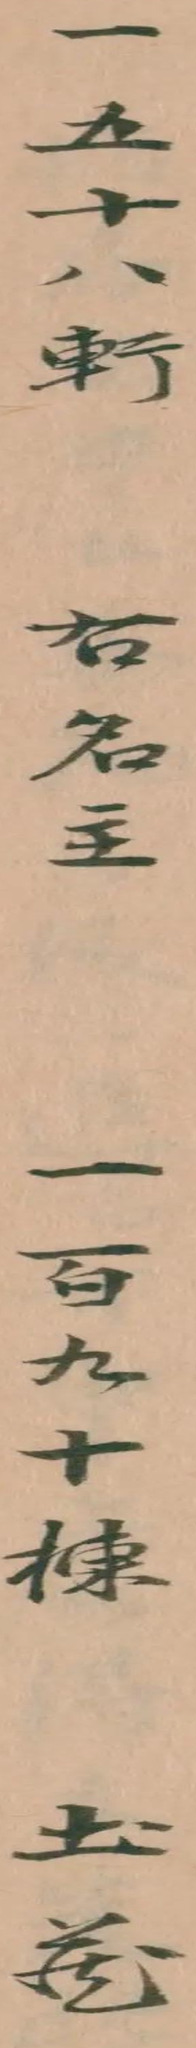一五十八軒右名主一百九十棟土蔵
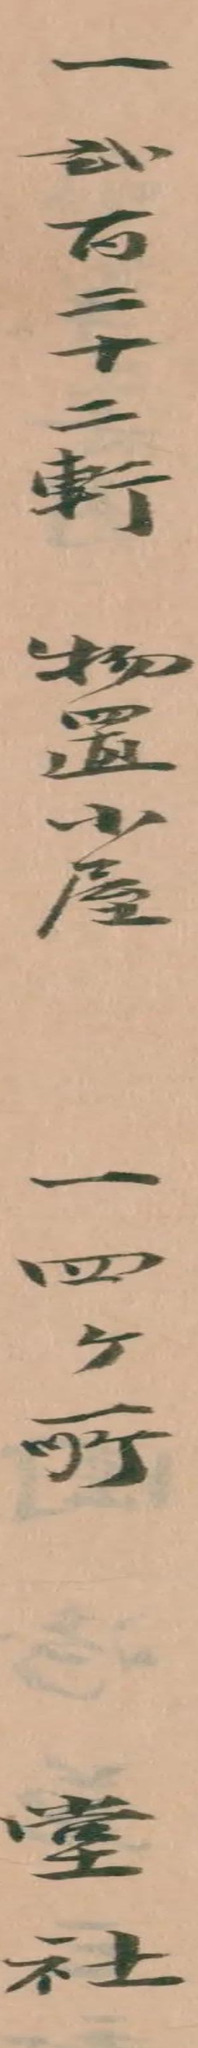一弐百二十二軒物置小屋一四ヶ所堂社
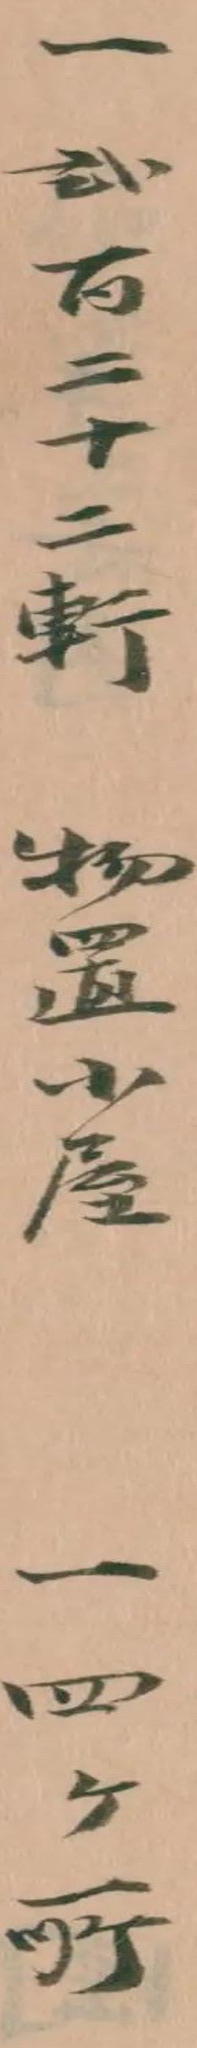一弐百二十二軒物置小屋一四ヶ所堂社
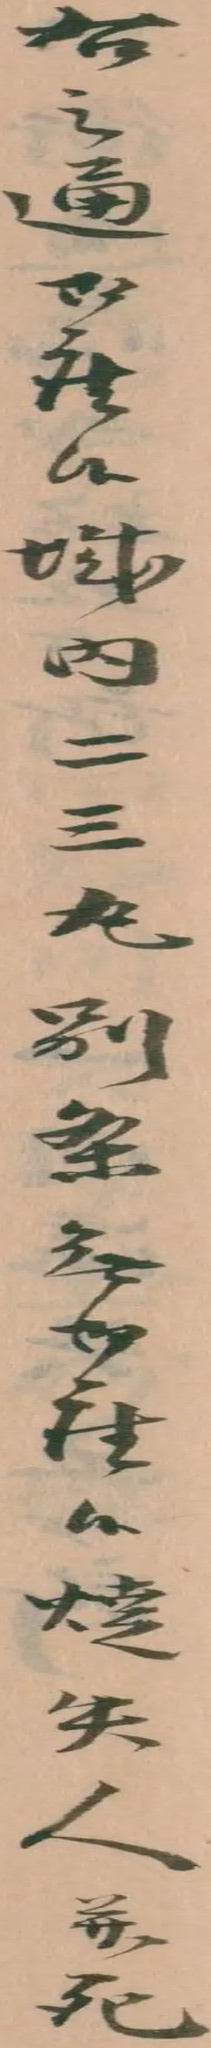之通御座候城内二三丸別状無御座候焼失人并死
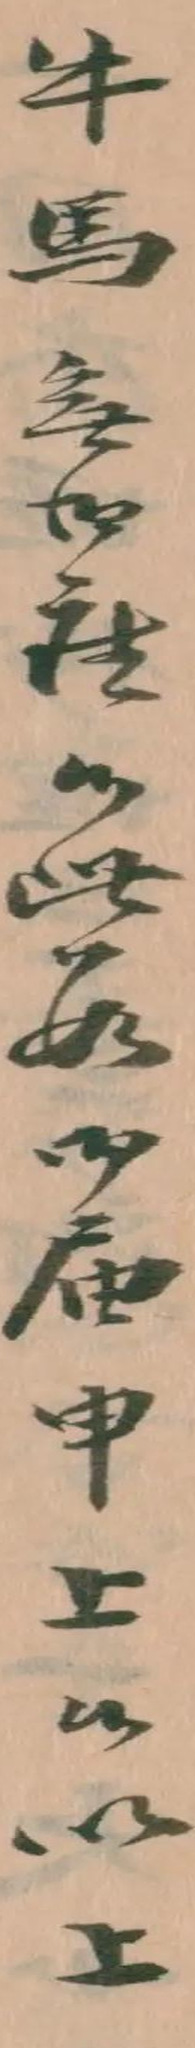牛馬無御座候此段御届申上候以上
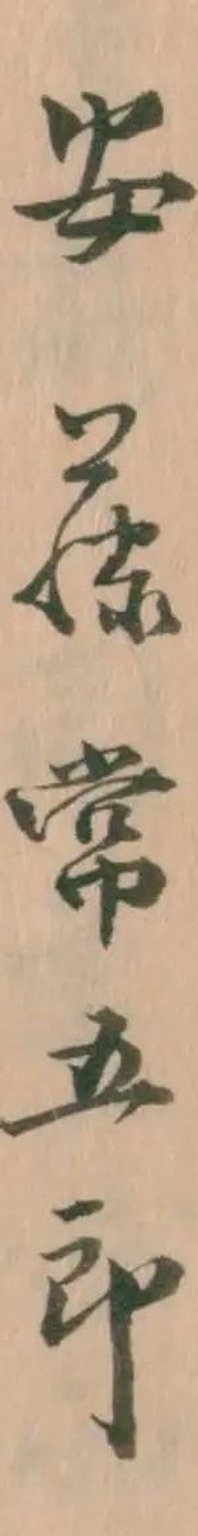安藤常五郎
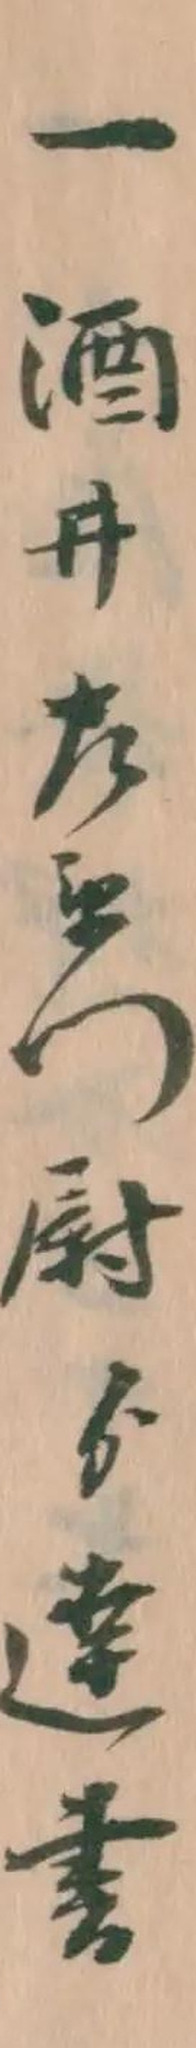一酒井左衛門尉ゟ達書
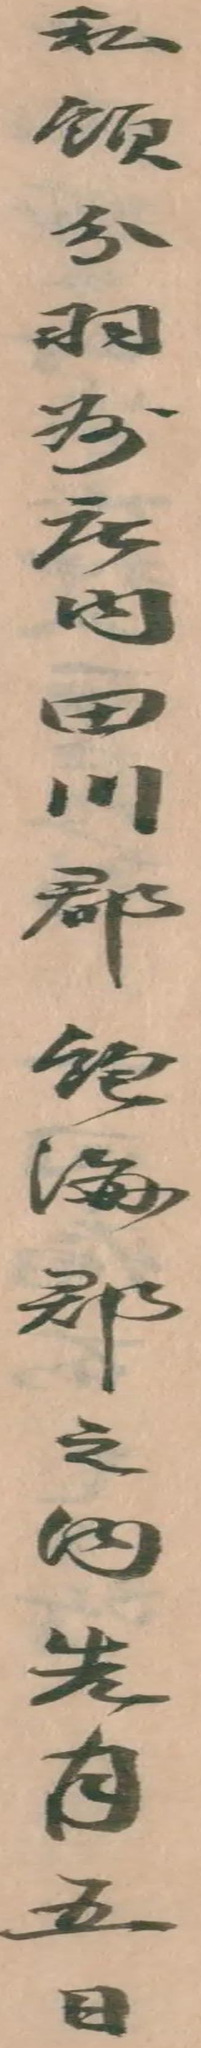私領分羽州庄内田川郡飽海郡之内先月五日
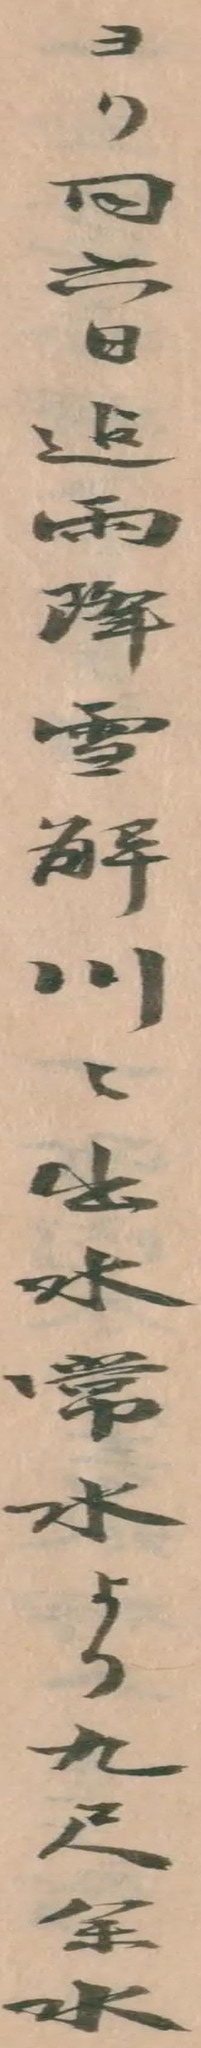より同六日迄雨降雪解川々出水常水ゟ九尺余水
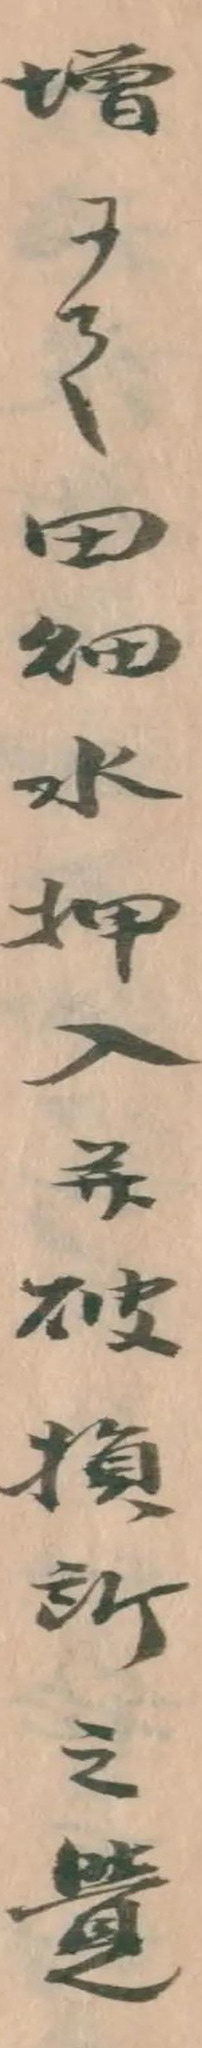増にて田畑水押入并破損所之覚
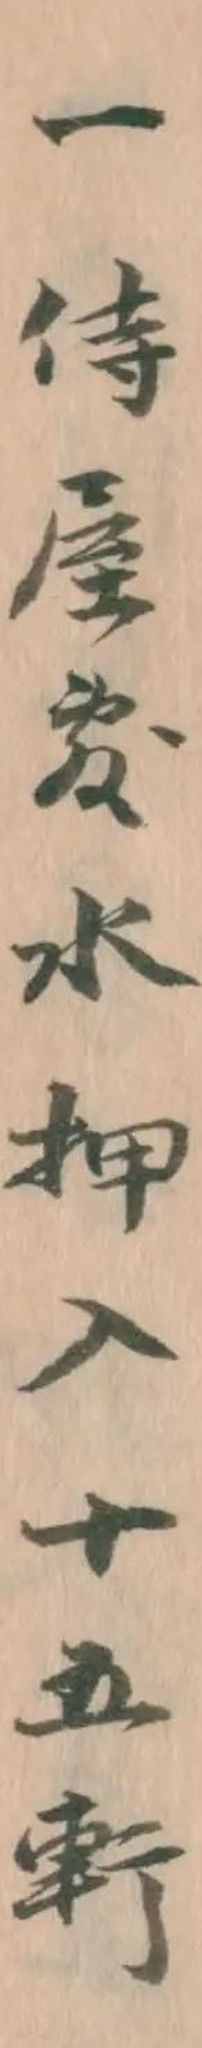一侍屋敷水押入十五軒

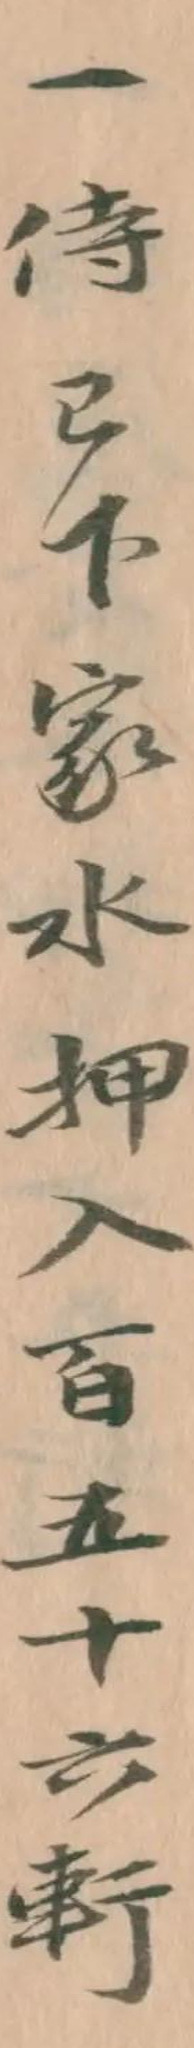一徒已下家水押入百五十六軒
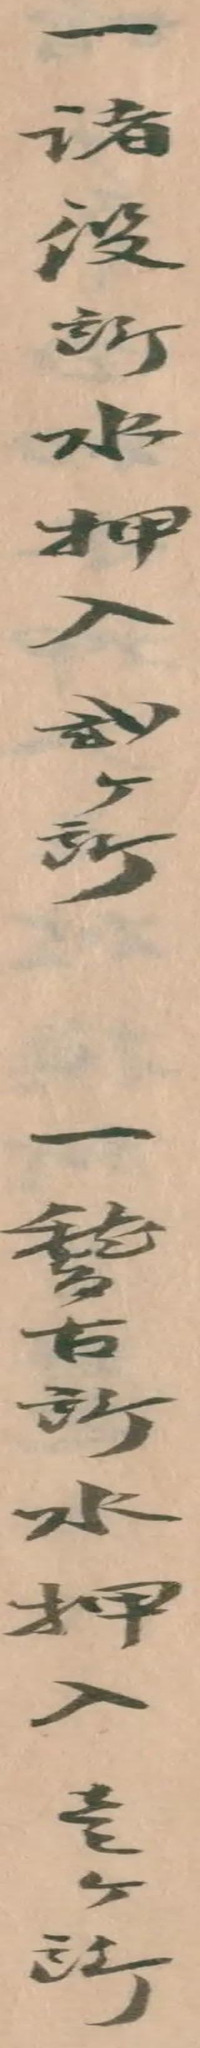一諸役所水押入弐ヶ所一稽古所水押入壱ヶ所
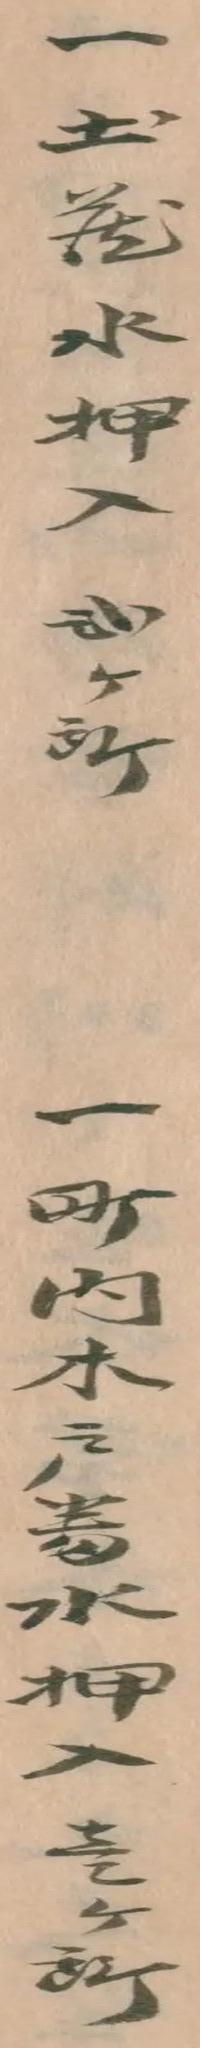一土蔵水押入弐ヶ所一町内木戸番水押入壱ヶ所
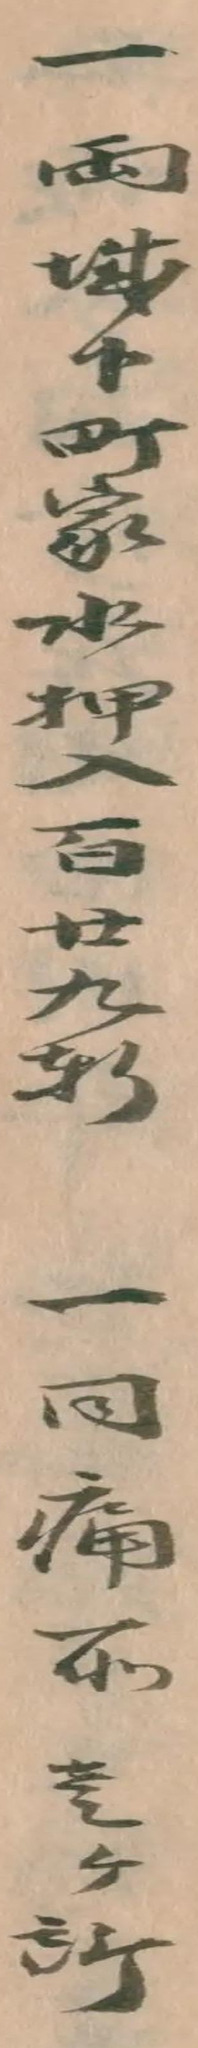一両城下町家水押入百廿九軒一同痛所壱ヶ所
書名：地災撮要. 巻3(地震之部)-巻4(噴火之部)
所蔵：国立国会図書館 National Diet Library, JAPAN
